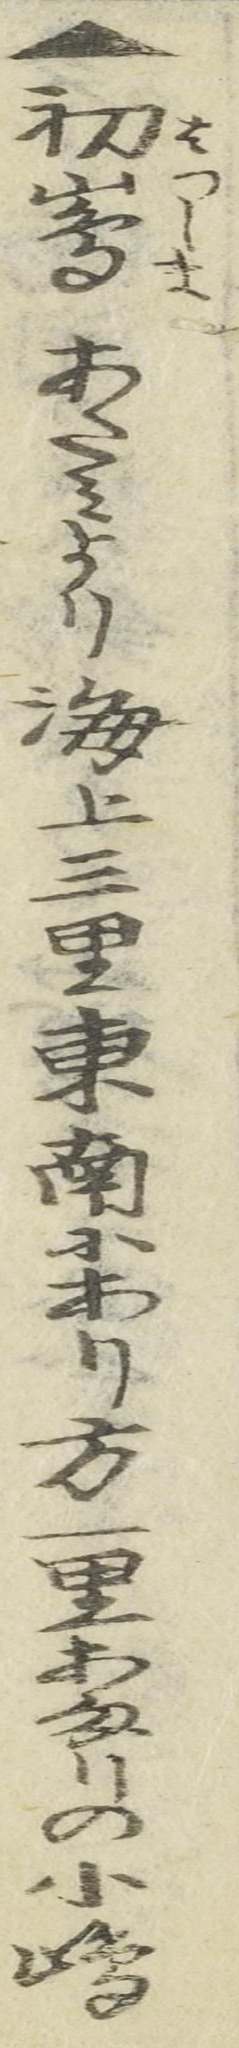▲初嶋あたみより海上三里東南にあり方一里あまりの小嶋
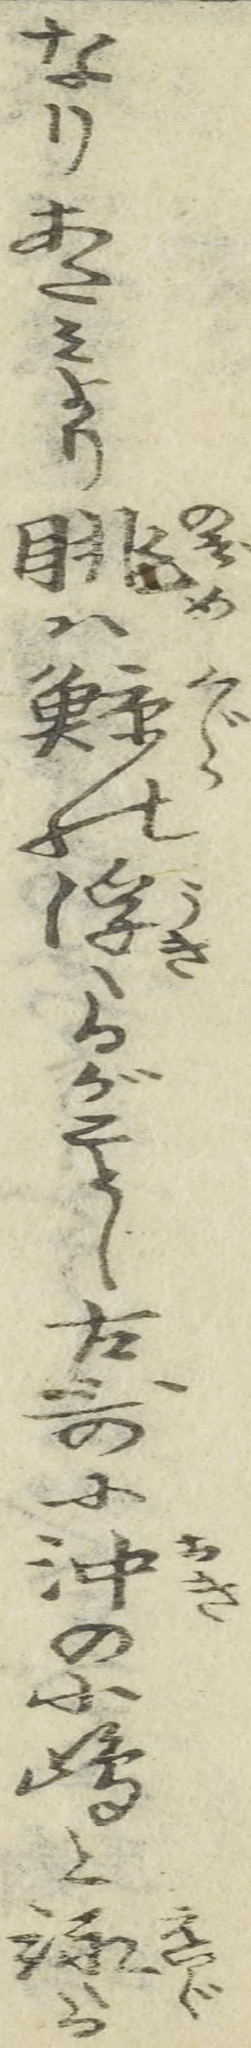なりあたみより眺は鯨の浮たるがことし古歌に沖の小嶋と詠たる
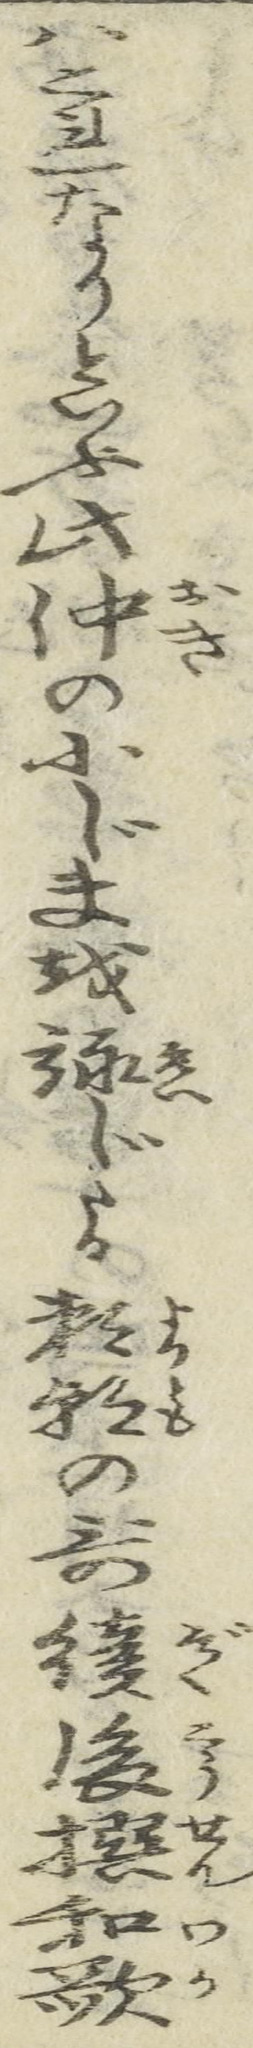はこれなりといふ此沖の小じまを詠じたる頼朝の歌続後撰和歌
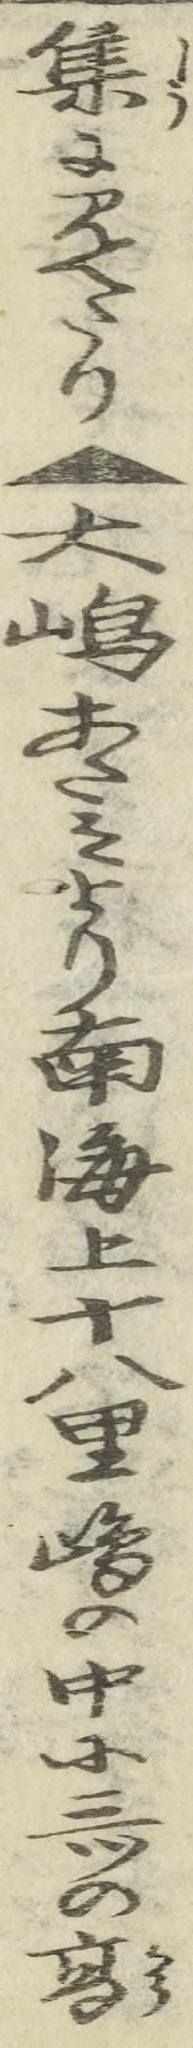集に見えたり▲大嶋あたみより南海上十八里嶋の中に三つの高
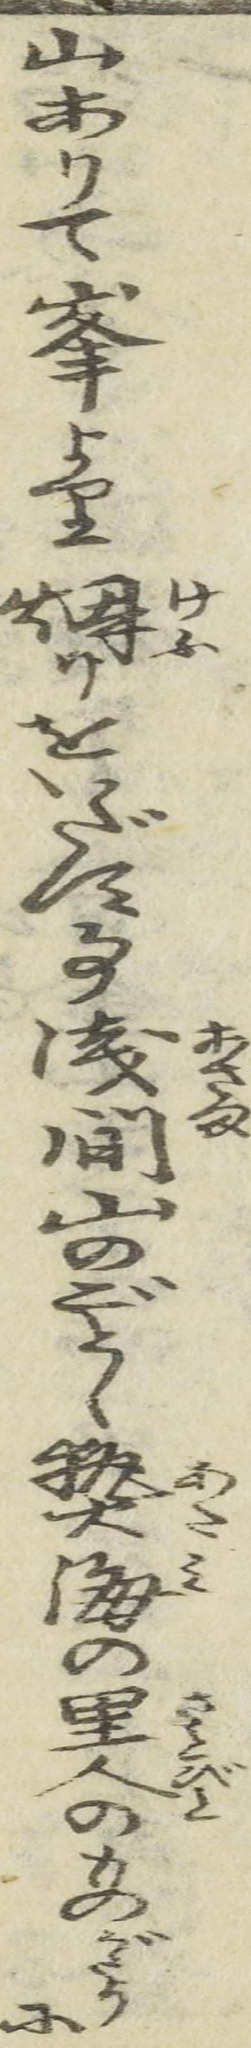山ありて峰より烟りをいだす事浅間山のごとし熱海の里人のものがたりに
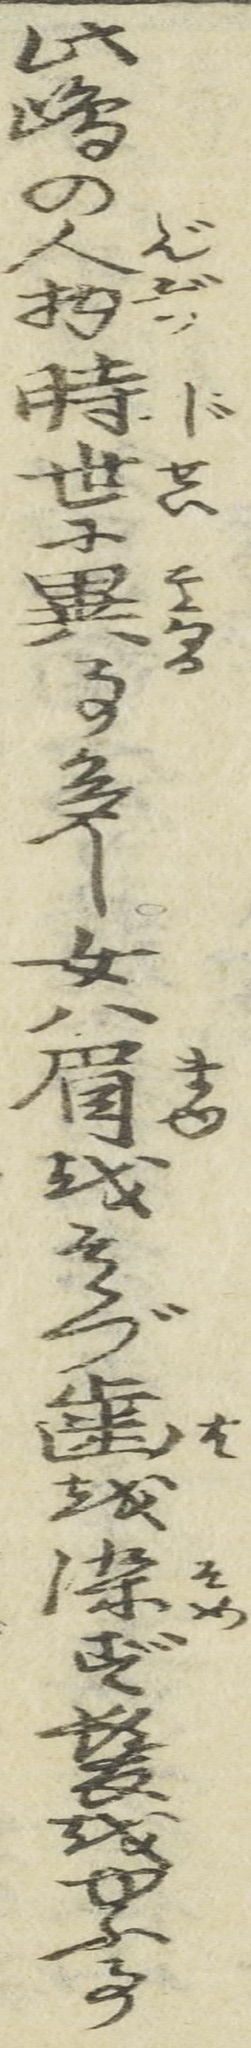此嶋の人物時世に異事多し女は眉をそらづ歯を染ず髪をゆふ事
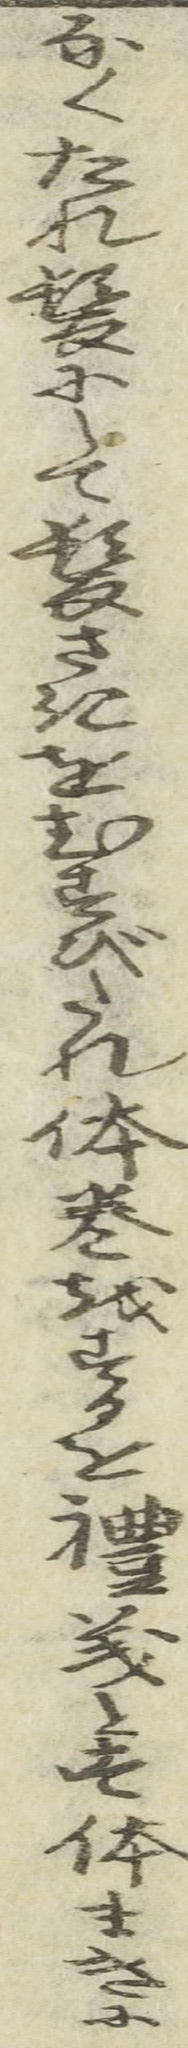なくたれ髪にして髪さきをむすびたれ体巻をするを礼義とす体まきに
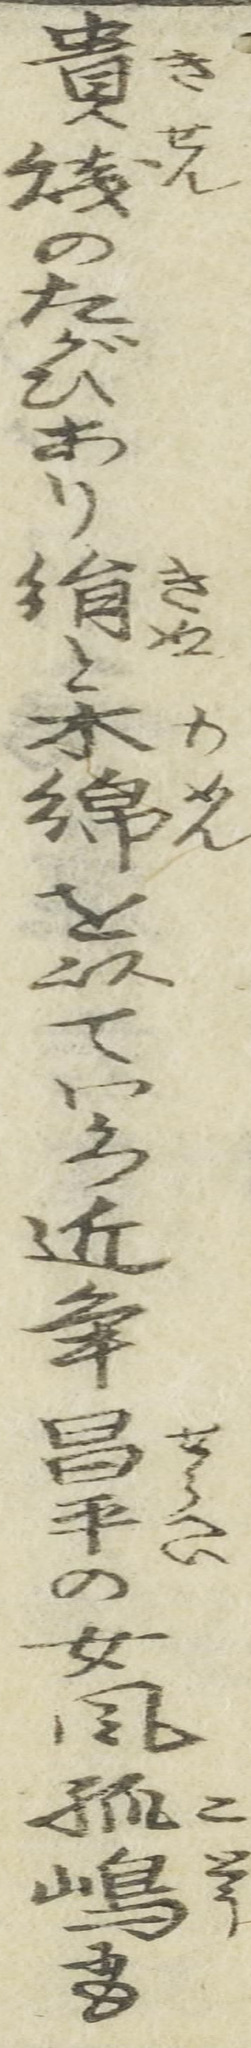貴賤のたがひあり絹と木綿を以てわかつ近年昌平の女風孤嶋にも
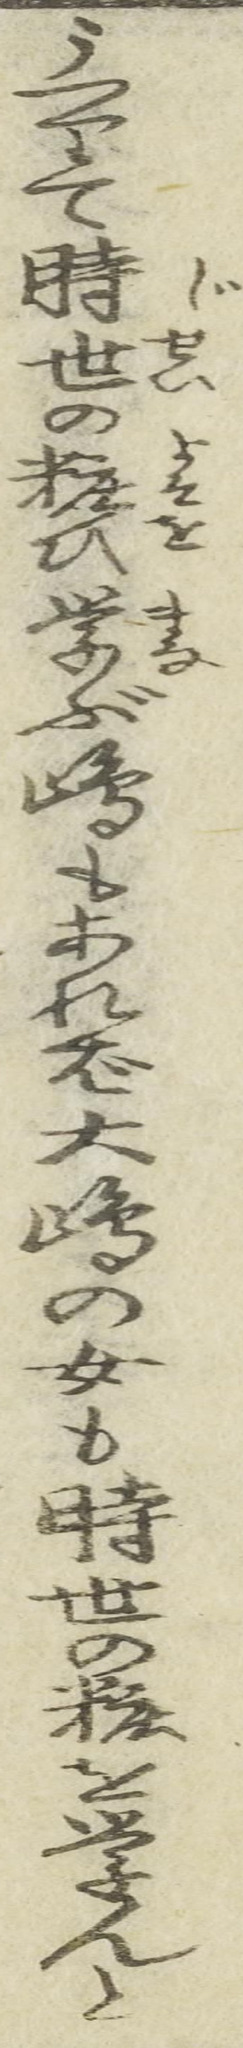うつりて時世の粧ひ学ぶ嶋もあれば大嶋の女も時世の粧を学んと
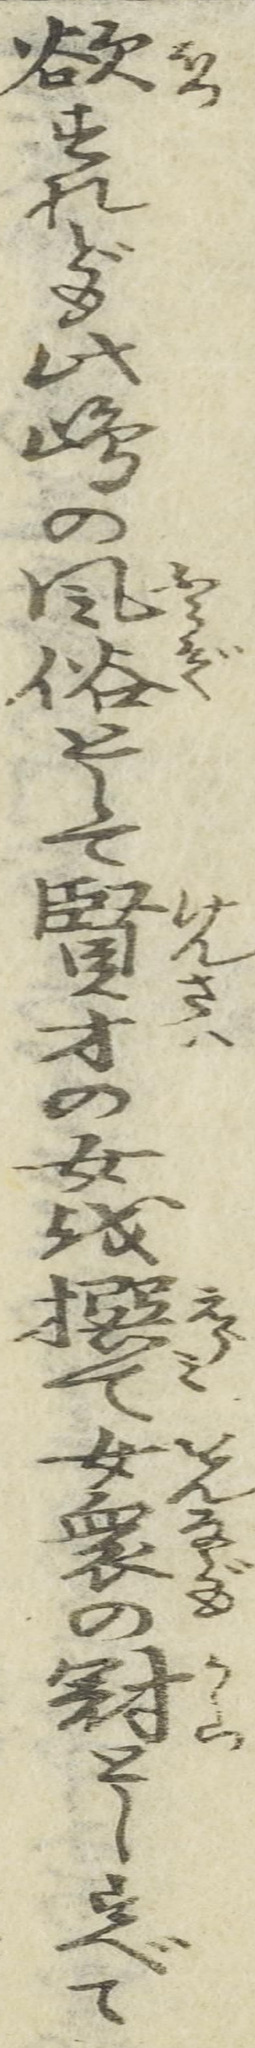欲すれども此嶋の風俗として賢才の女を撰て女衆の魁としすべて
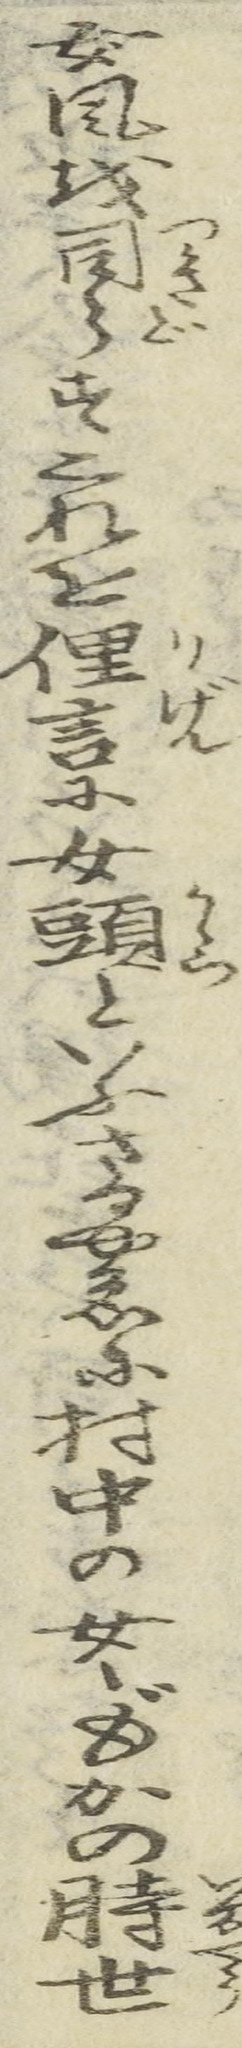女風を司らすこれを俚言に女頭といふさるゆゑに村中の女どもかの時世
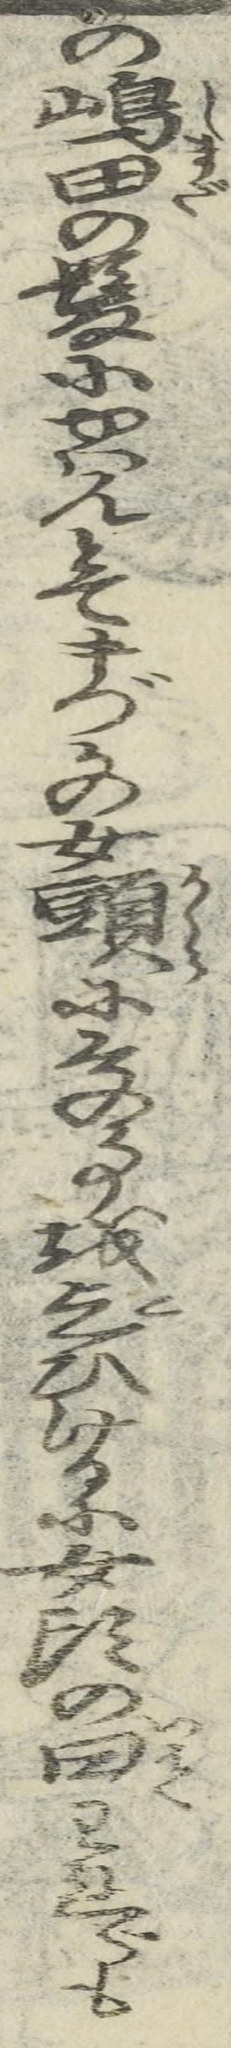の嶋田髪にゆはんとてまづかの女頭にその事を乞ひけるに女頭の曰われらも
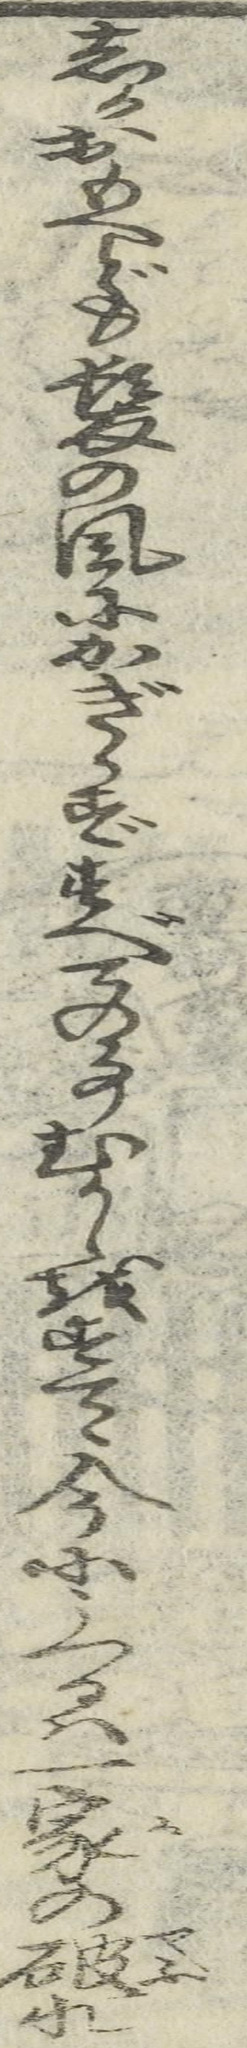しかおもへども髪の風にかぎらずすべての事むかしをすてゝ今にうつるは一家の破れ
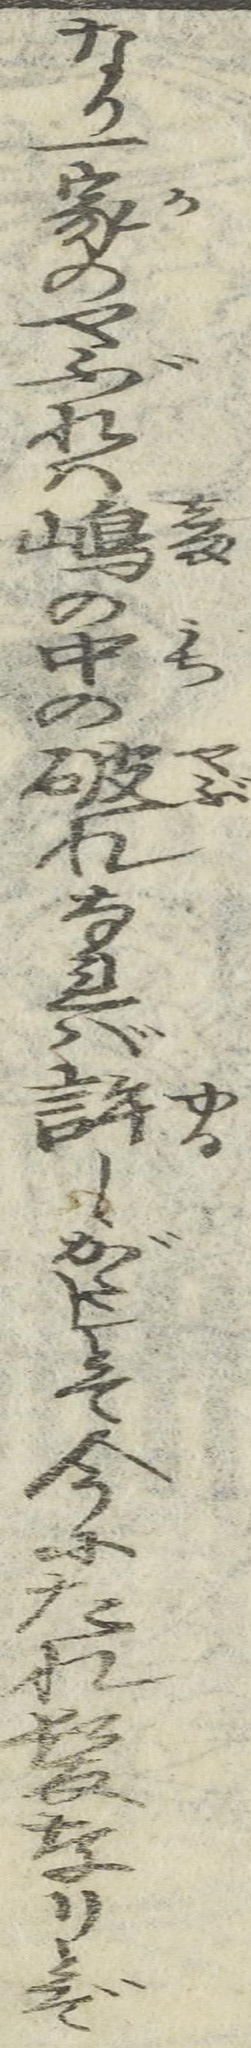なり一家のやぶれは嶋の中の破れなれば許しがたしとて今にたれ髪なりとぞ
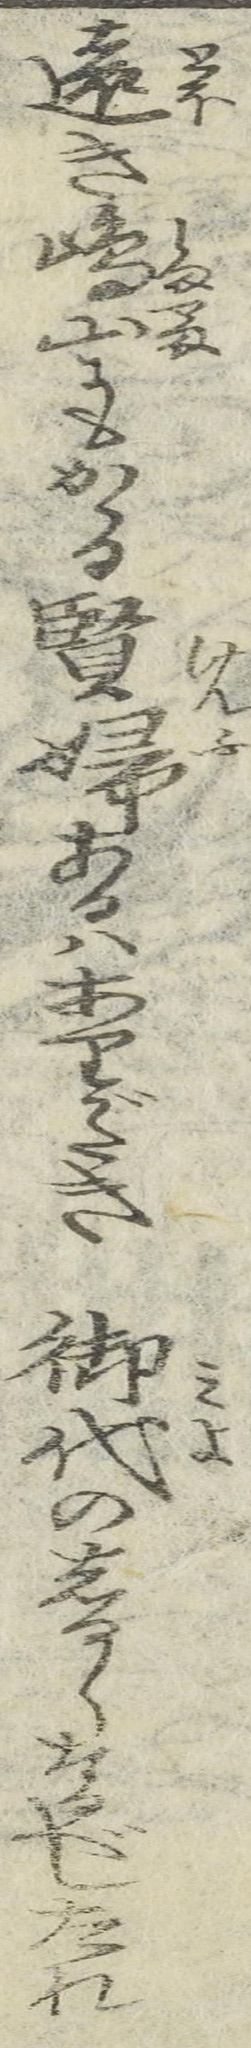遠き嶋山にもかゝる賢婦あるはありがたき御代のしるしなるべしたれ
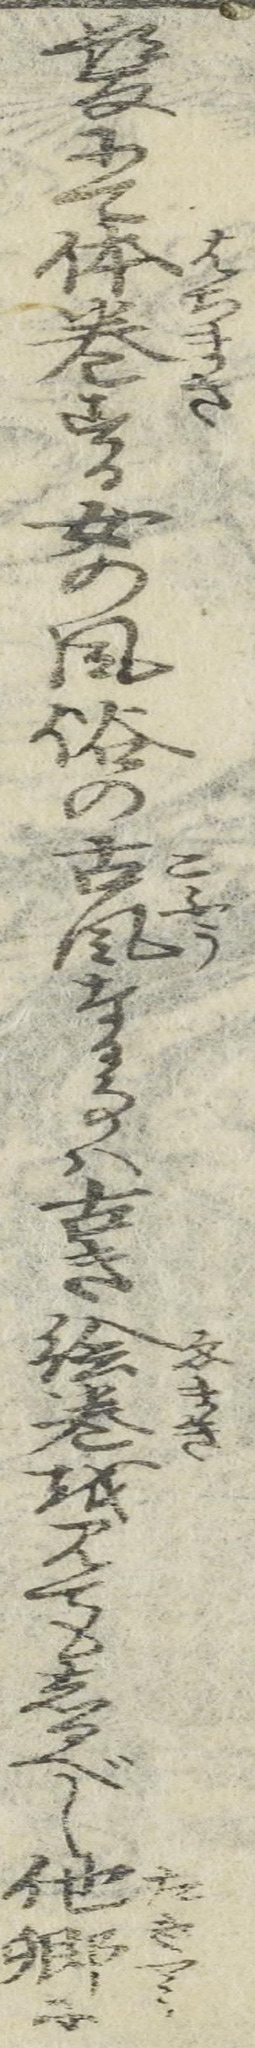髪にて体巻する女の風俗の古風なる事は古き絵巻を見てもしるべし他郷に
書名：熱海温泉圖彙
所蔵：東京大学地震研究所図書室 Earthquake Research Institute Library, The University of Tokyo, JAPAN
